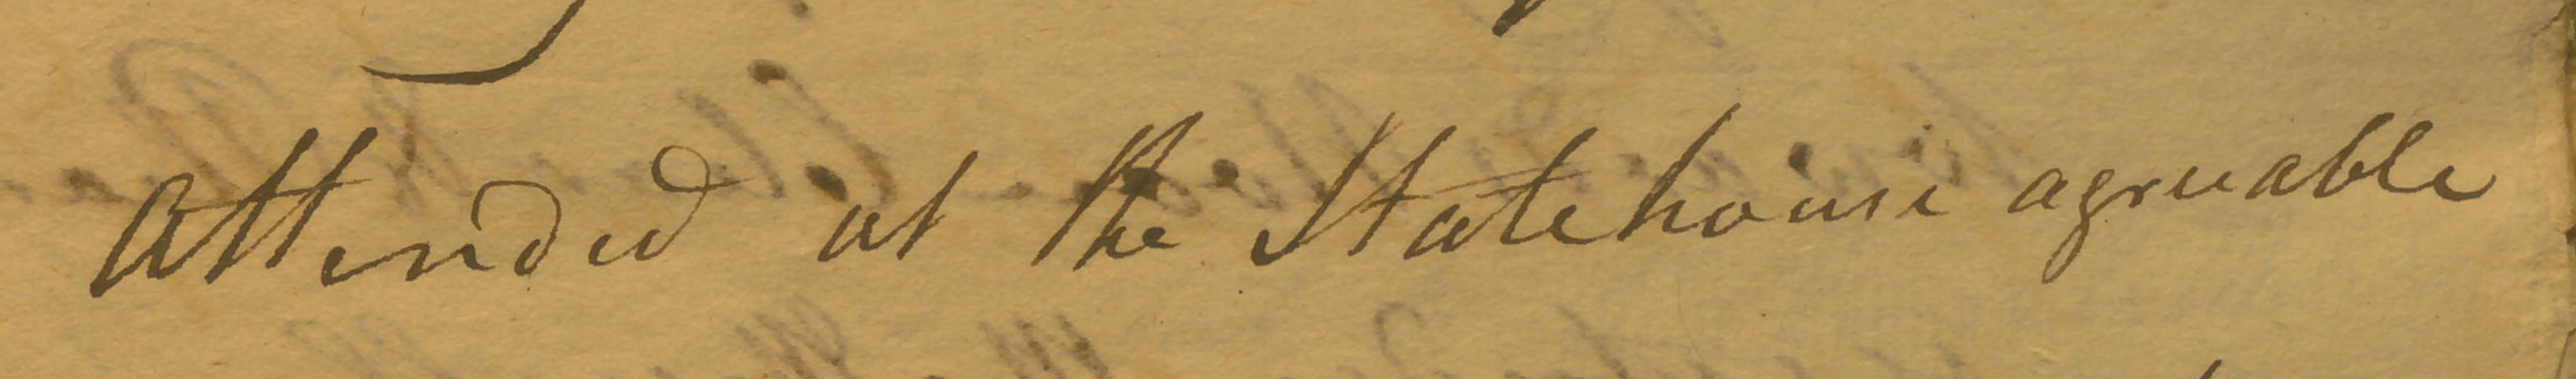attended at the State house agreeable
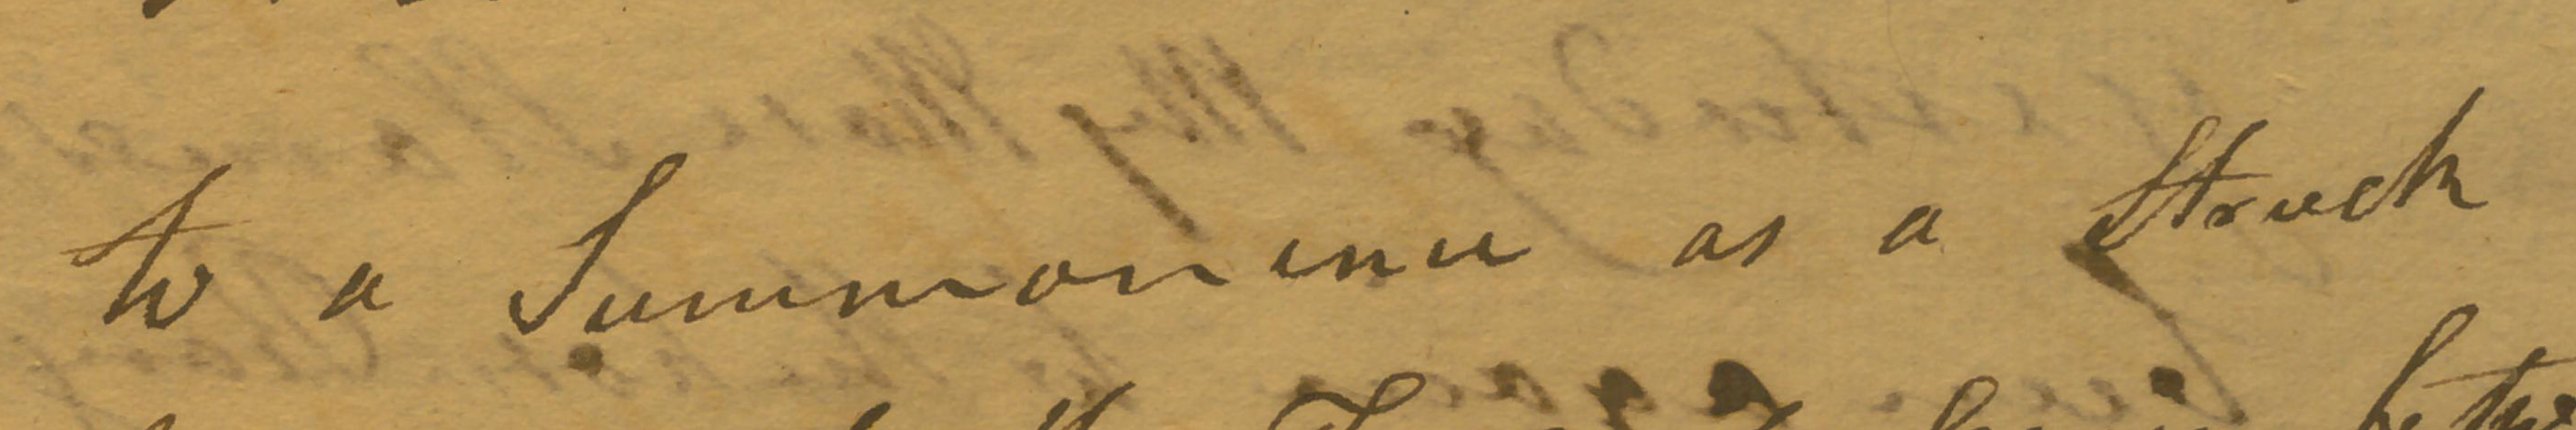1 a Summonence as a Struck
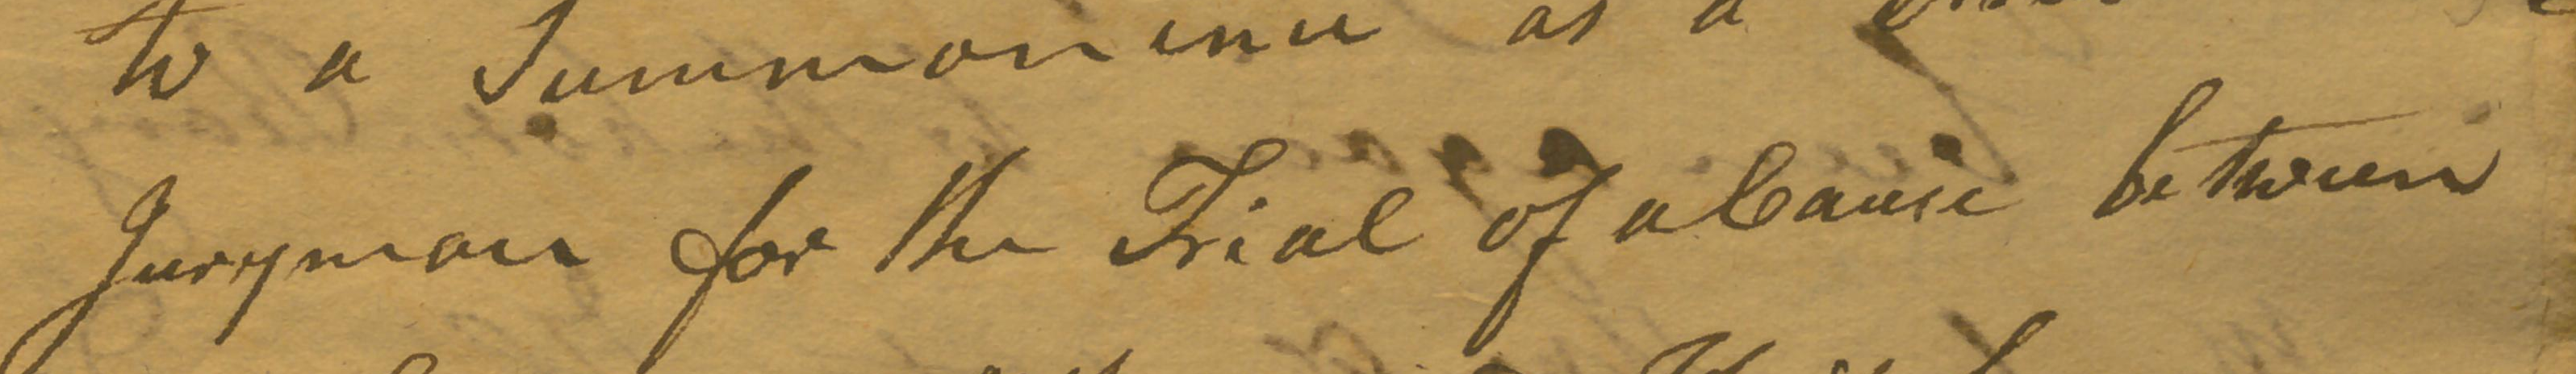Juryman for the Trial of a Cause between
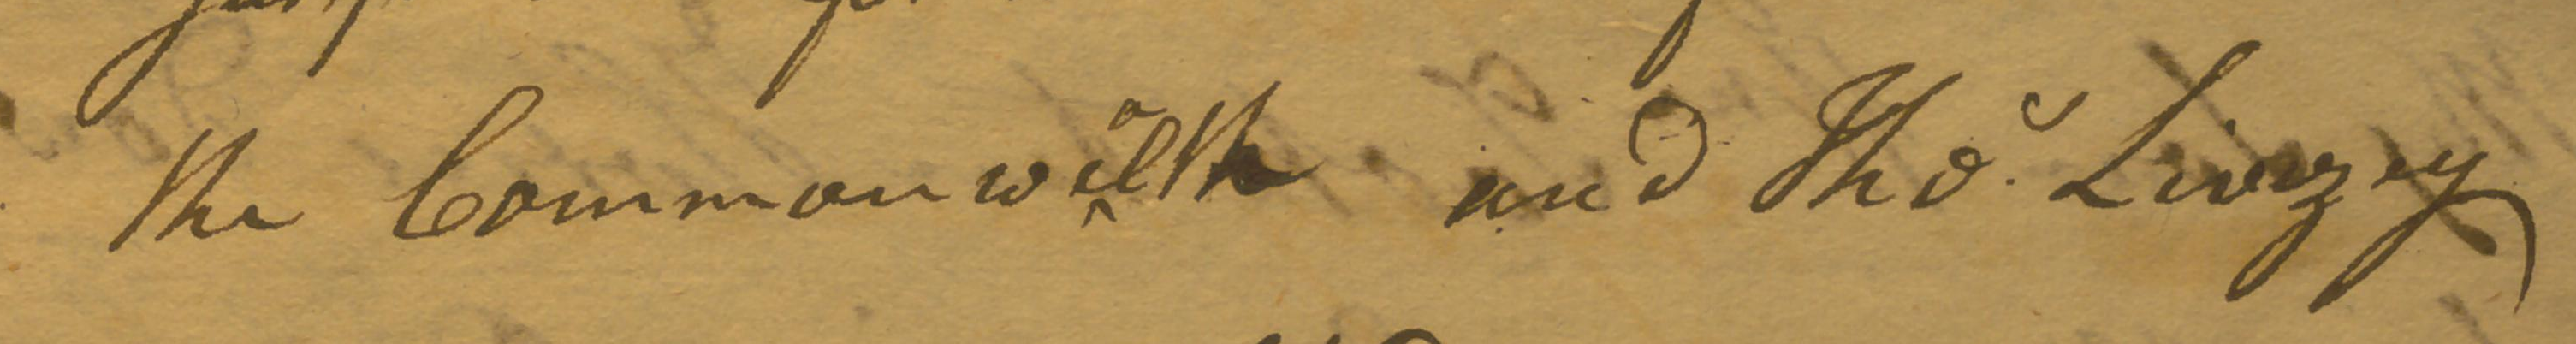The Commonwe^alth and Tho^s. Livezey
